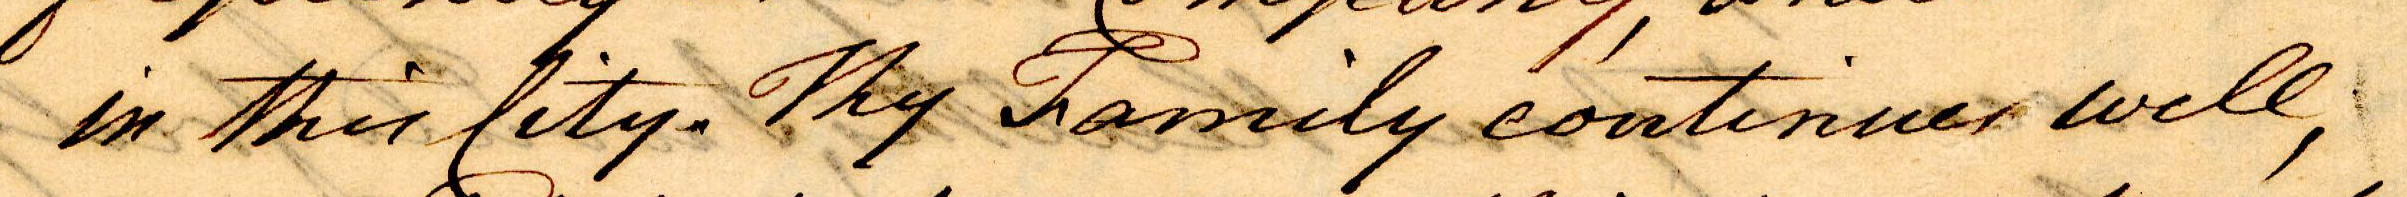in this City. Thy Family continues well,
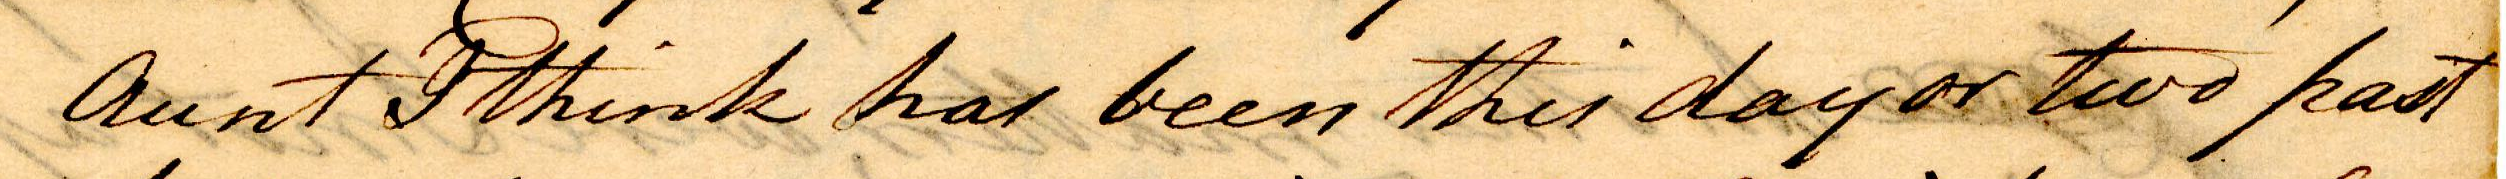Aunt I think has been this day or two past
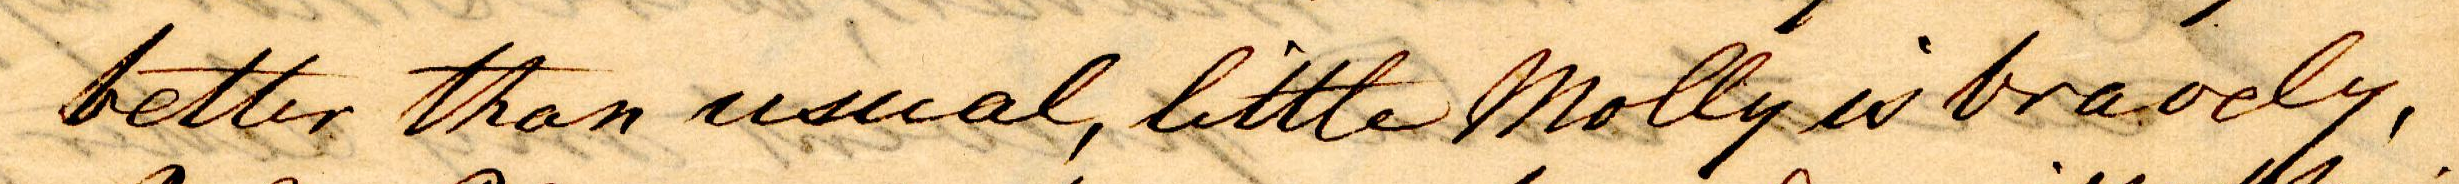better than usual, little Molly is bravely,
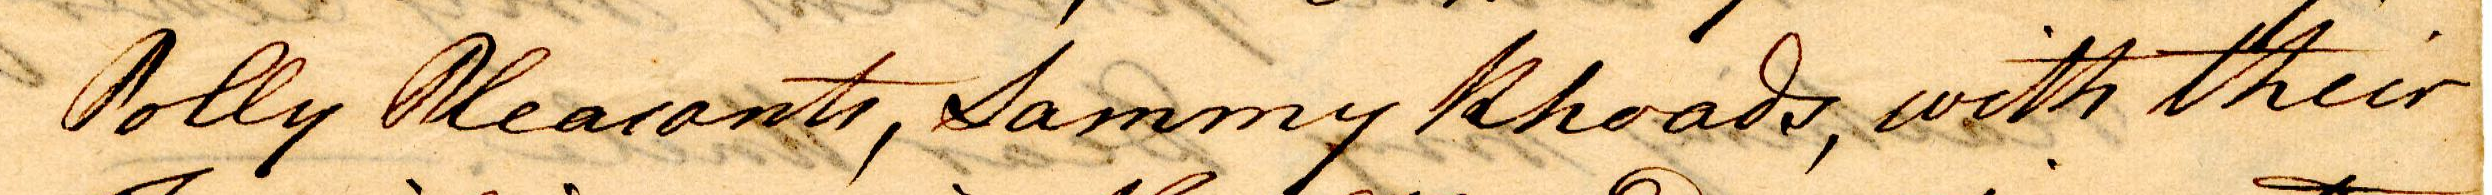Polly Pleasants, Sammy Rhoads, with their
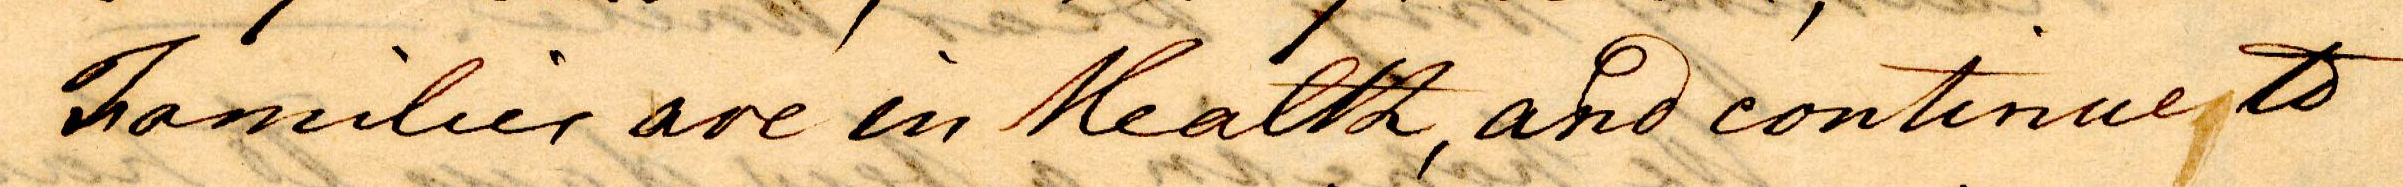Families are in Health, and continue to
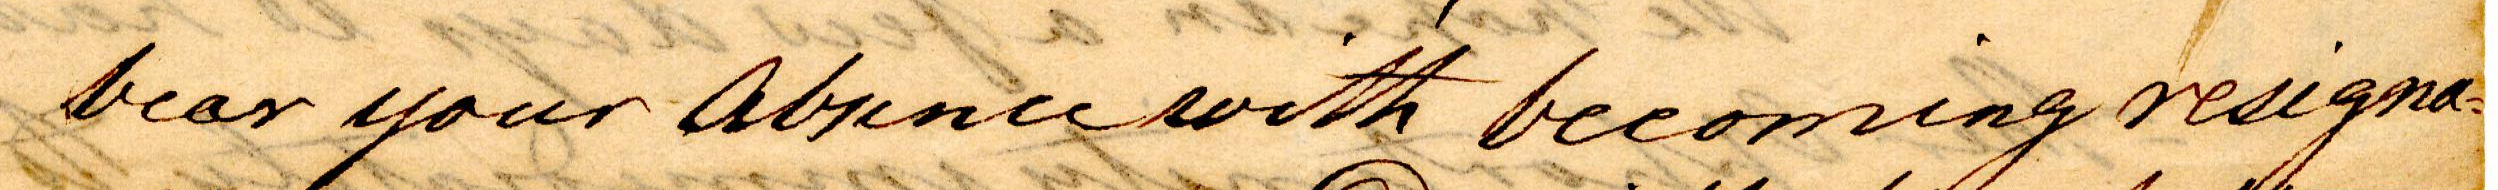bear your Absence with becoming resigna-
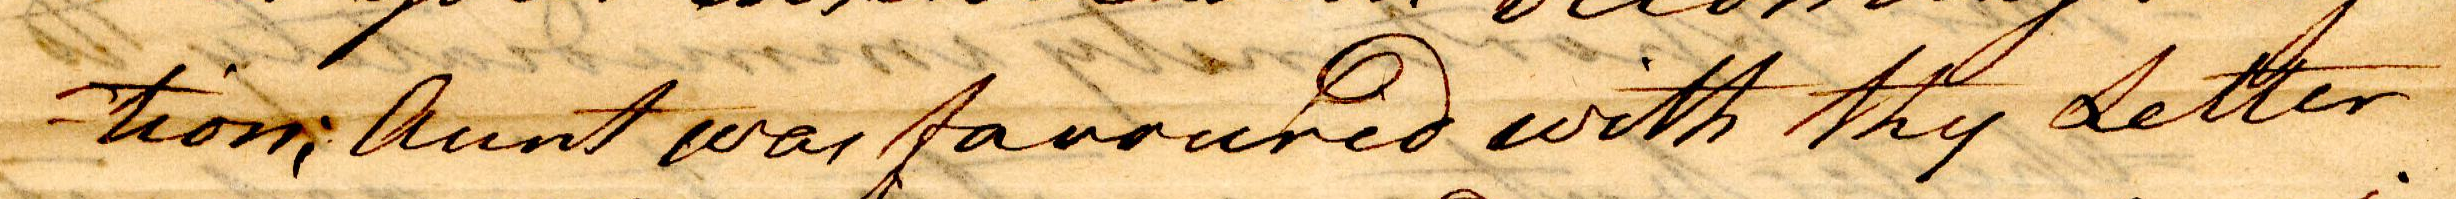-tion; Aunt was favoured with thy Letter
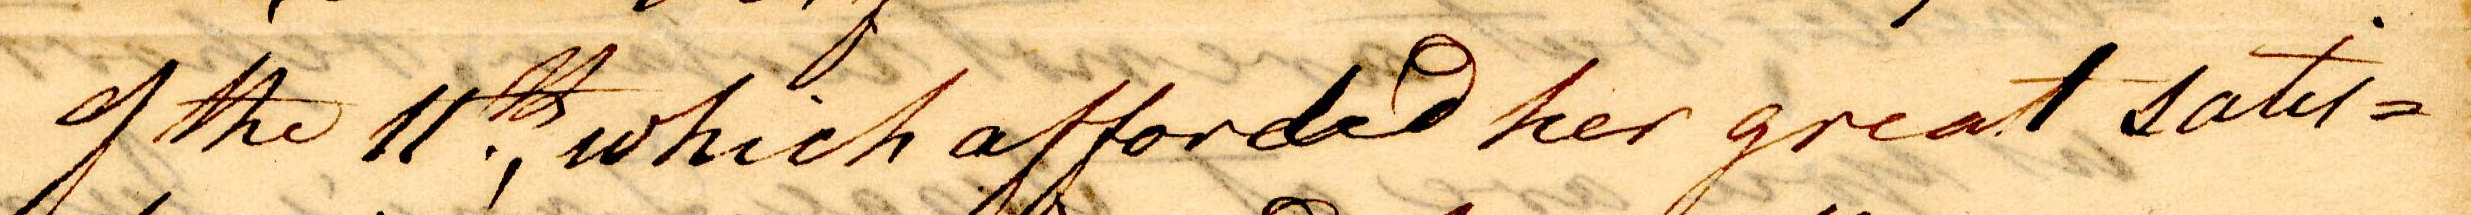of the 11^th., which afforded her great satis-
